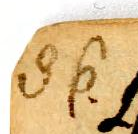36
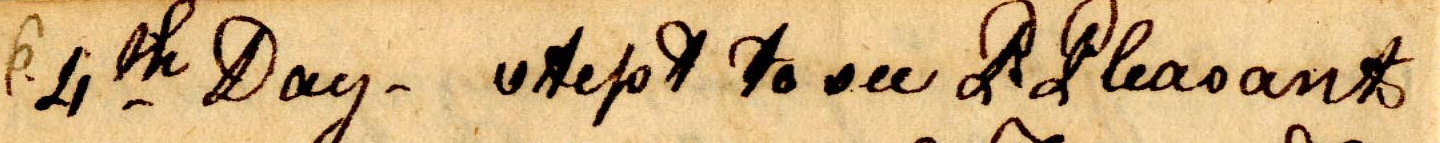4^th Day- stept to see P Pleasants
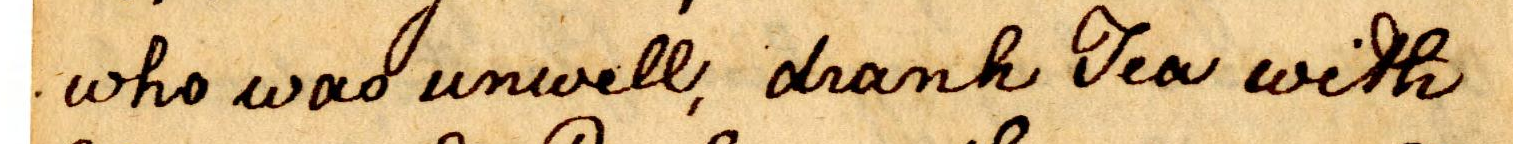who wad unwell, drank Tea with
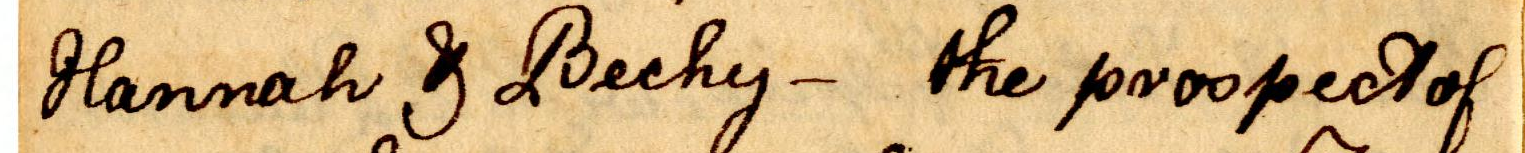Hannah & Becky- the prospect of
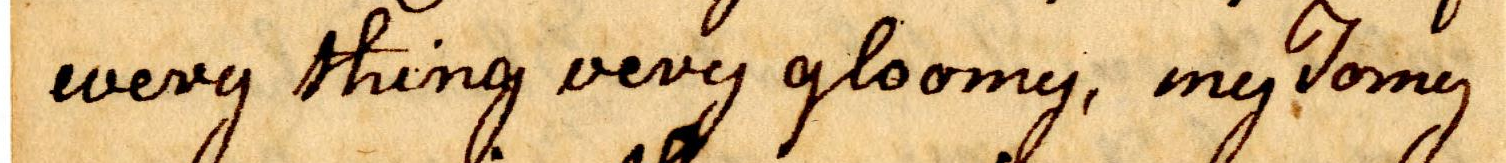every thing very gloomy, my Tomy
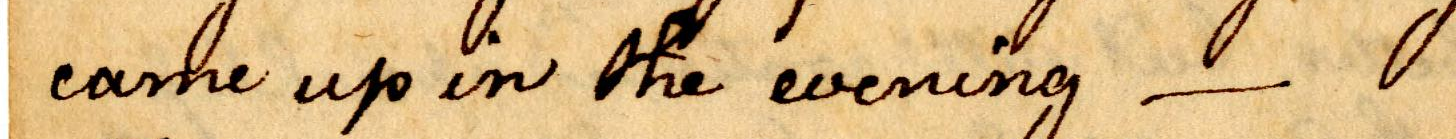came up in the evening-
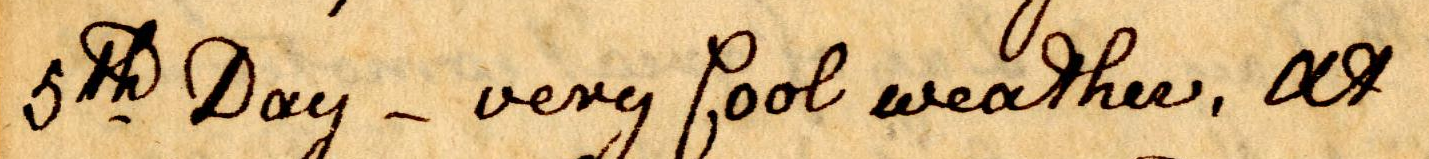5^th Day- very Cool weather, at
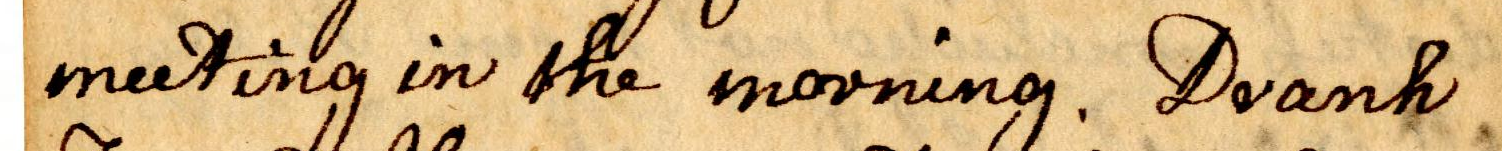meeting in the morning, Drank
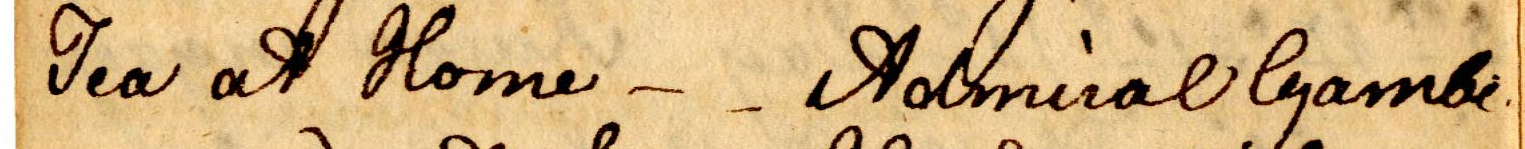Tea at Home- Admiral Gambe
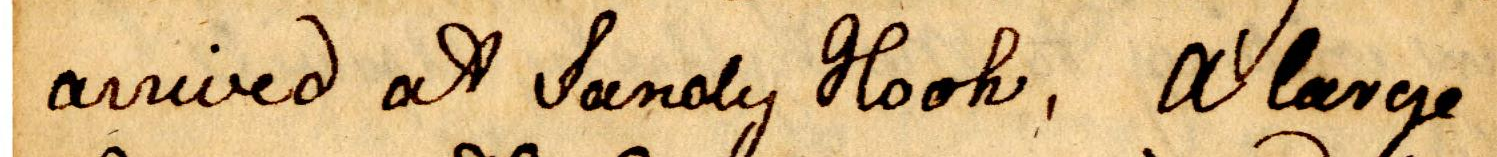arrived at Sandy Hook, A large
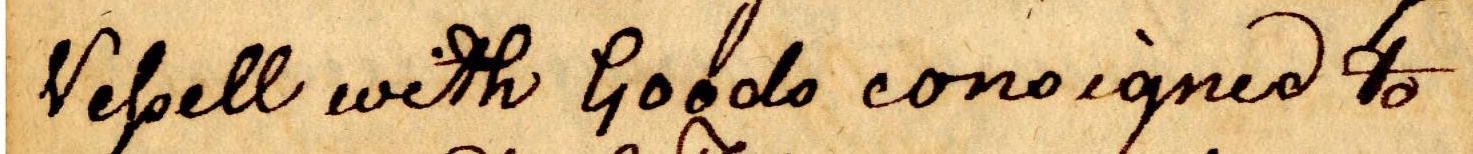Vessell with Goods consigned to
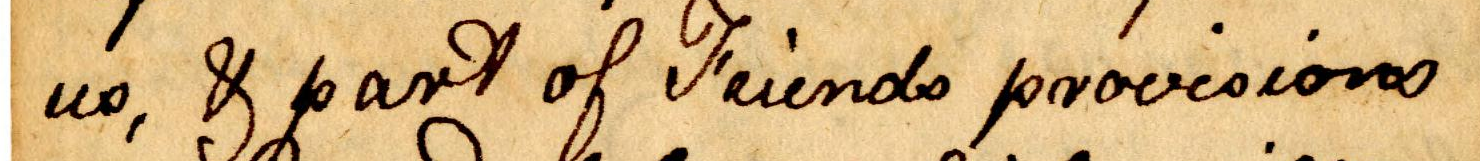us, & part of Friends provisions
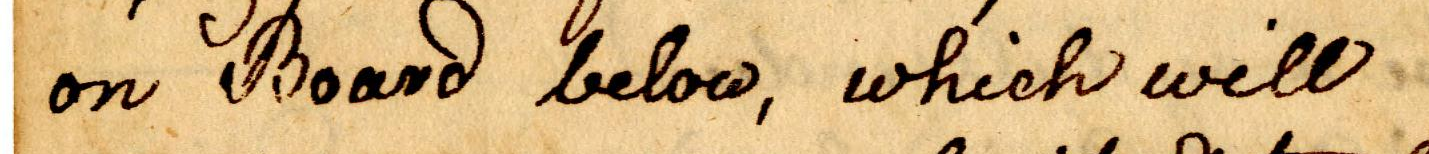on Board below, which will
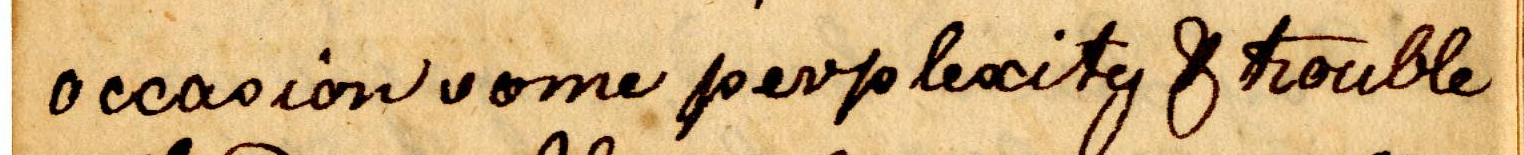occasion some perplexity & trouble
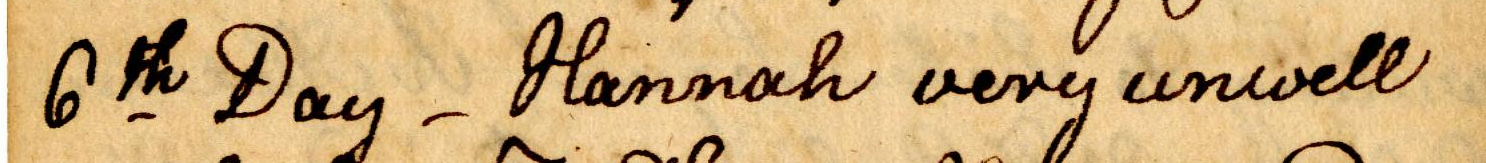6^th Day- Hannah very unwell
